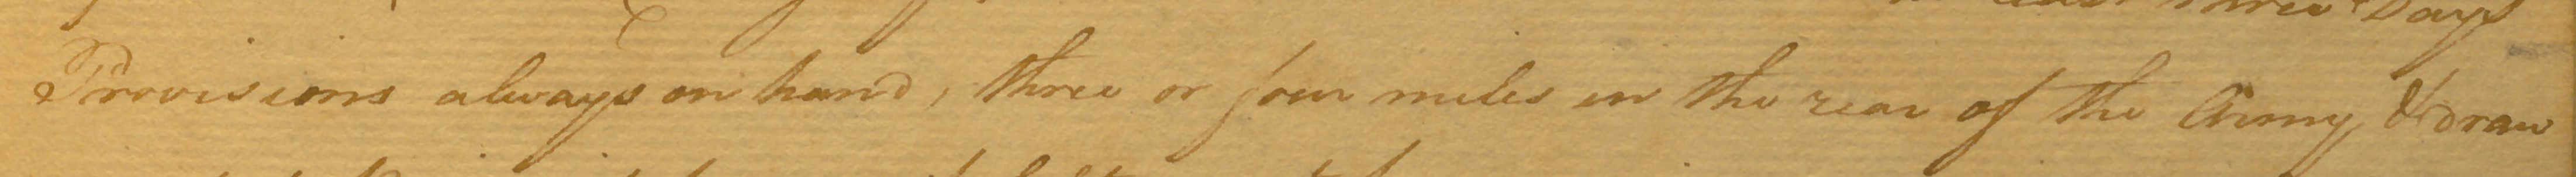Provisions always on hand, three or four miles in the rear of the Army & draw
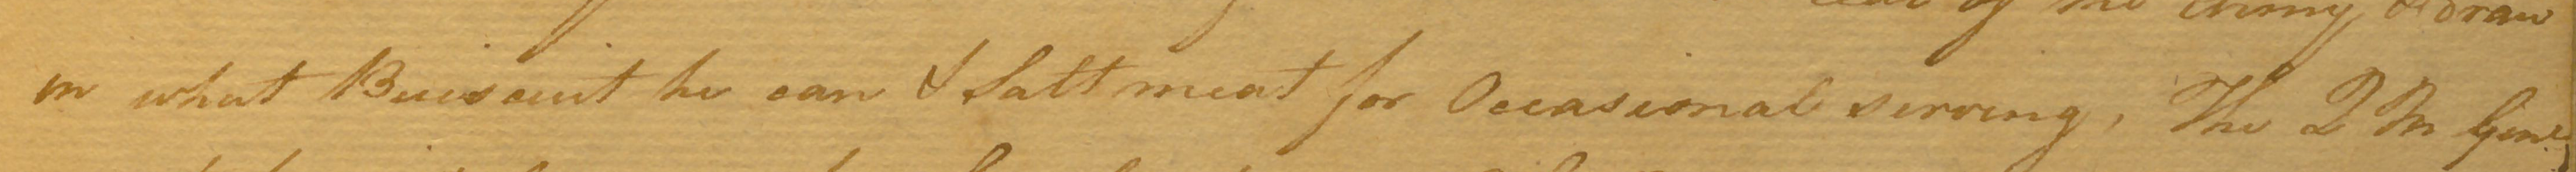in what Buiscuits he can & Salt meat for Occasional serving, The Q M Gen^l.
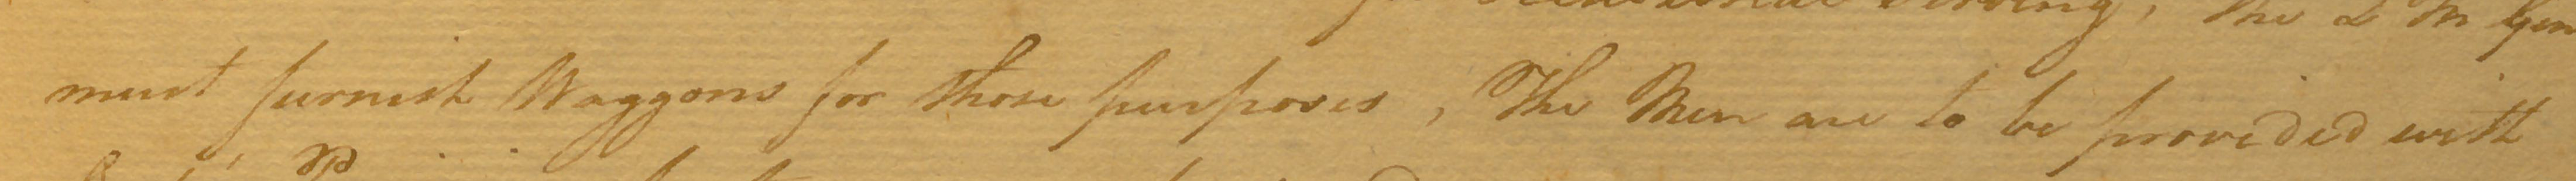must furnish Waggons for those purposes, The Men are to be provided with
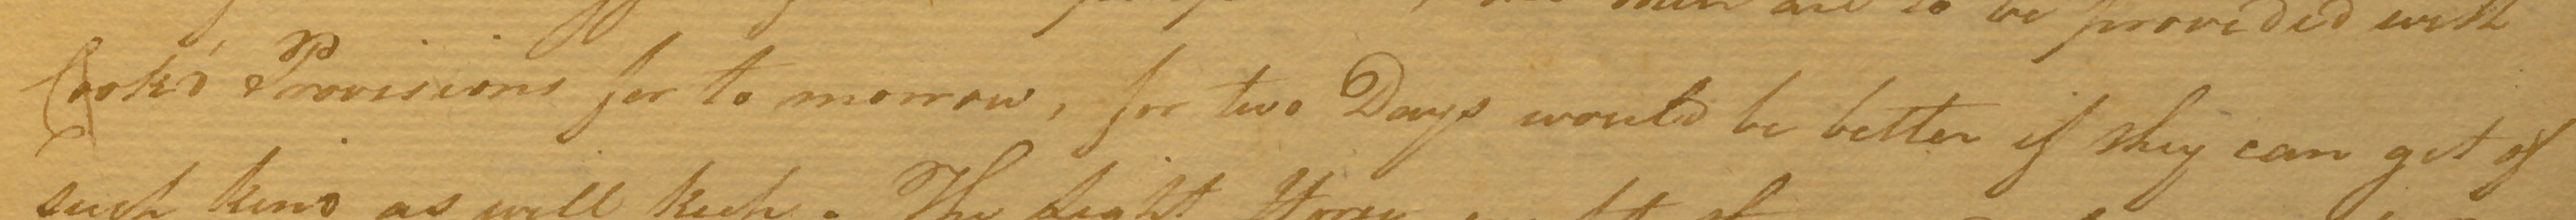Cooks Provisions for to morrow, for two Days would be better if they can get of
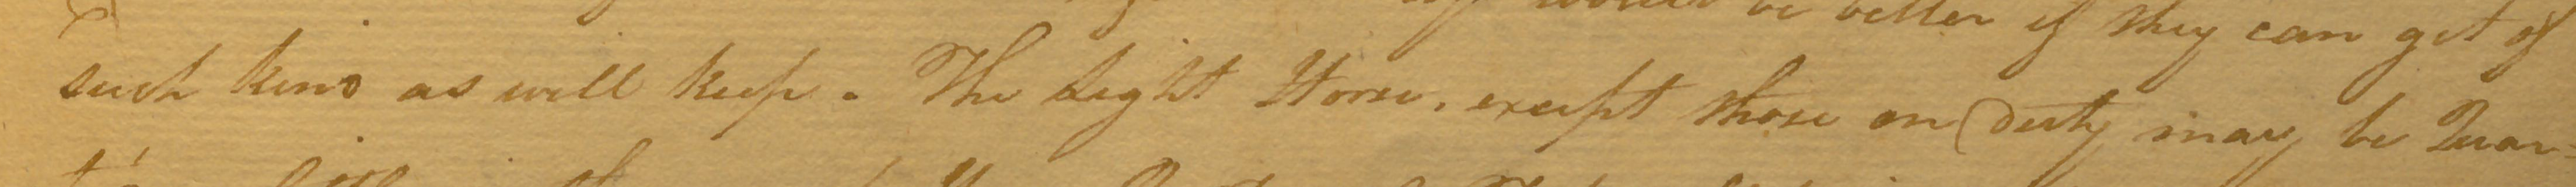such kind as will keep. The Light Horse, except those on duty may be Quar
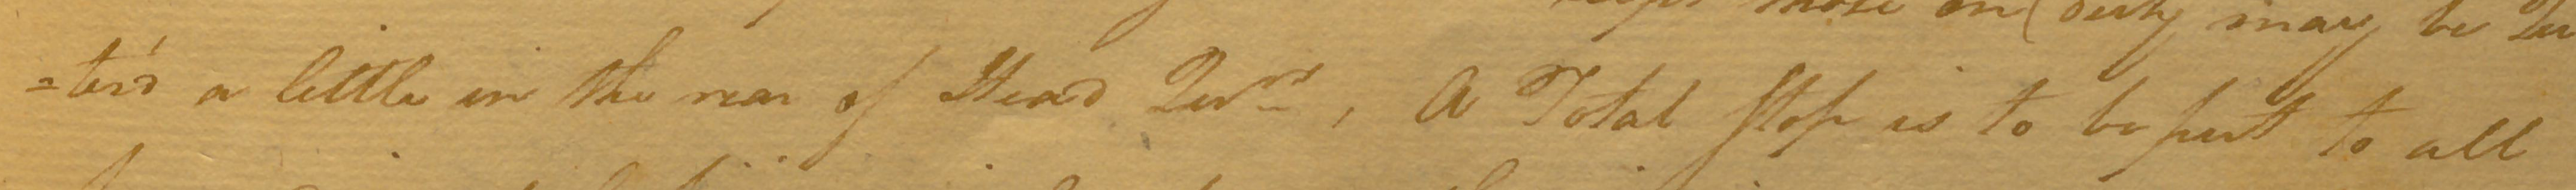-ter'd a little in the rear of Head Qu^rs, A Total stop is to be put to all
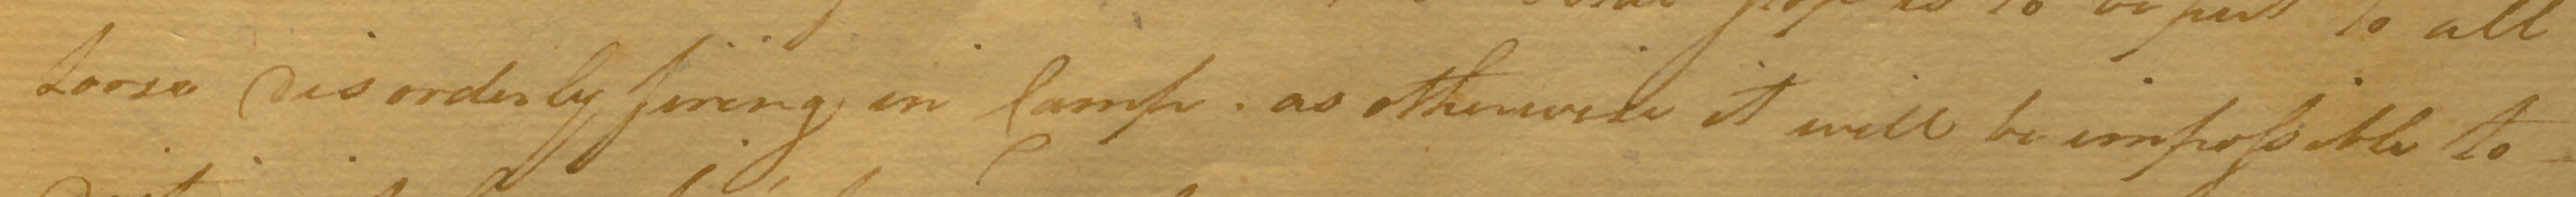Loose disorderly firing in Camp as otherwise it will be impossible to
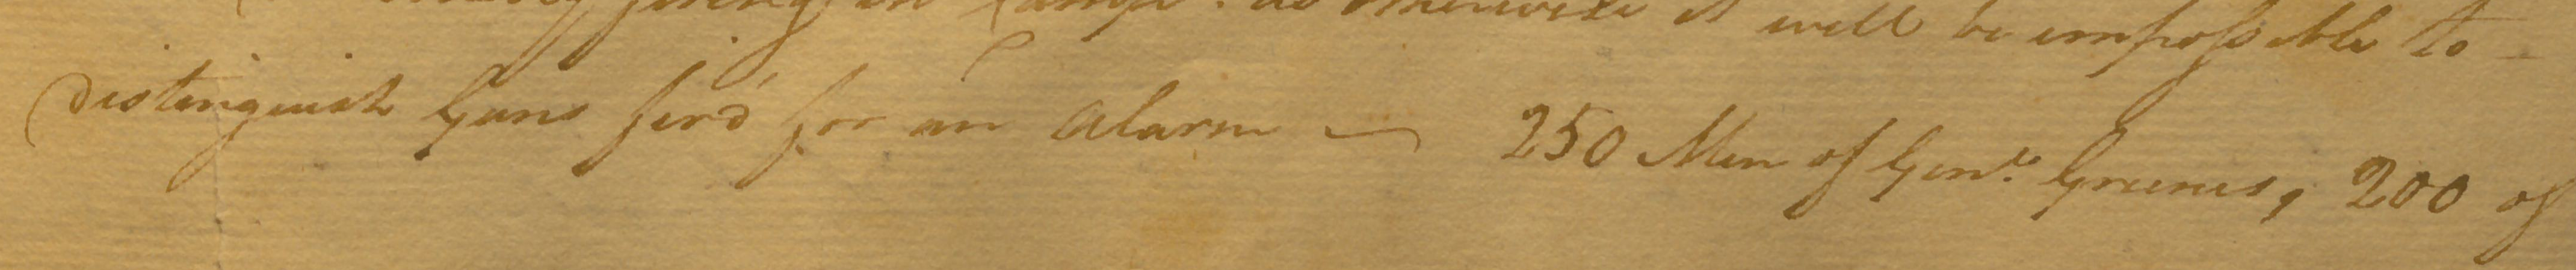distinguish Guns fir'd for an alarm- 250 Men of Gen^l Greenes, 200 of
